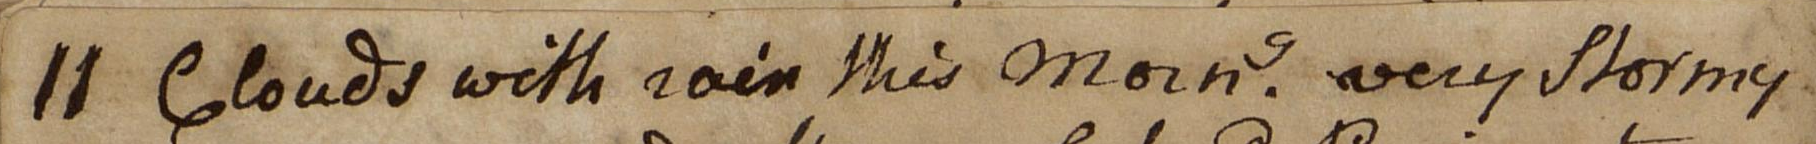11 Clouds with rain this Morn^g very Stormy
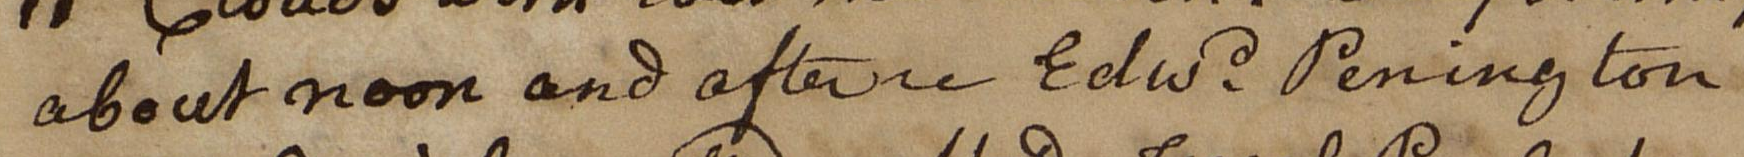about noon and after- Edw^d. Pening ton
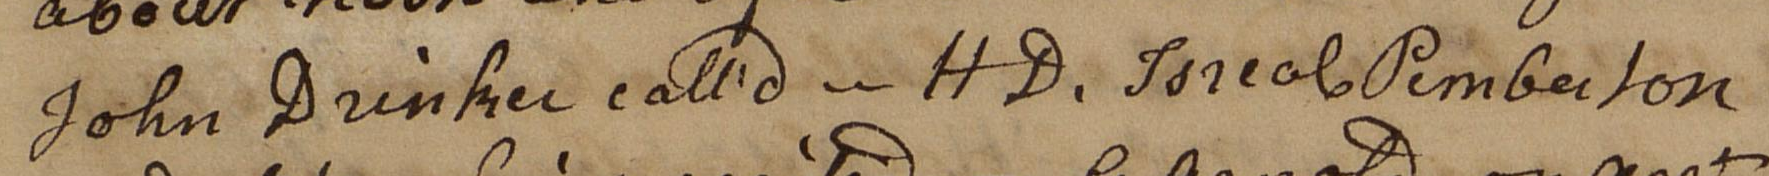John D rinker call'd- H D. Isreal Pemberton
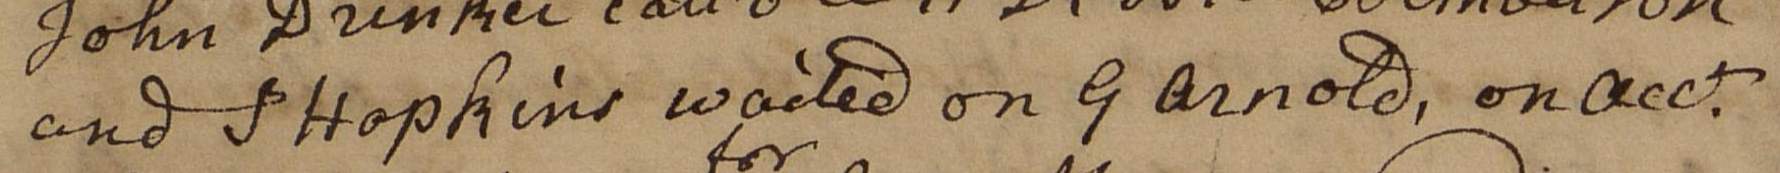and S Hopkins waited on G Arnold, on acc^t.
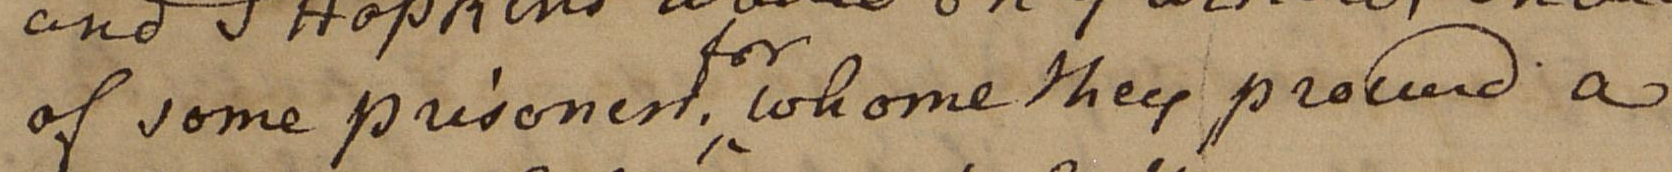of some prisoner. ^for whome they procurd a
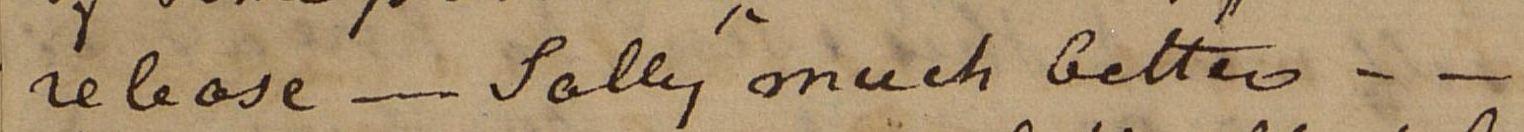release- Sally much better--
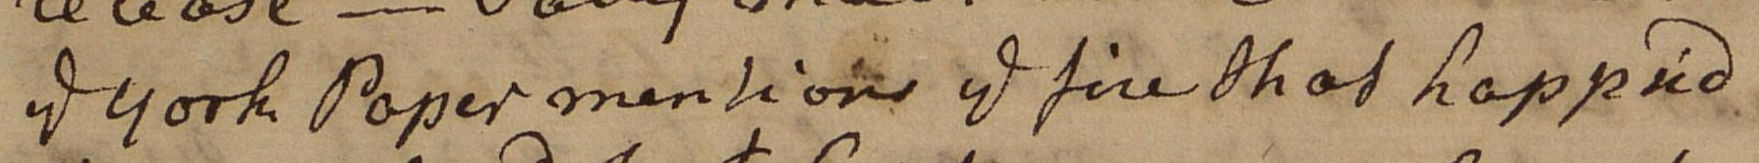y^e York Paper mentions y^e fire that happn'd
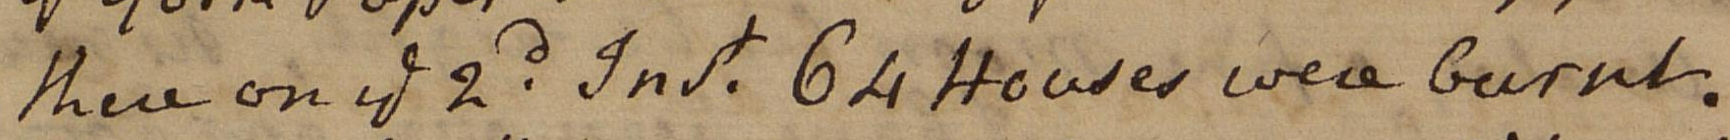there on y^e 2^d. Ins^t. 64 Houses were burnt.
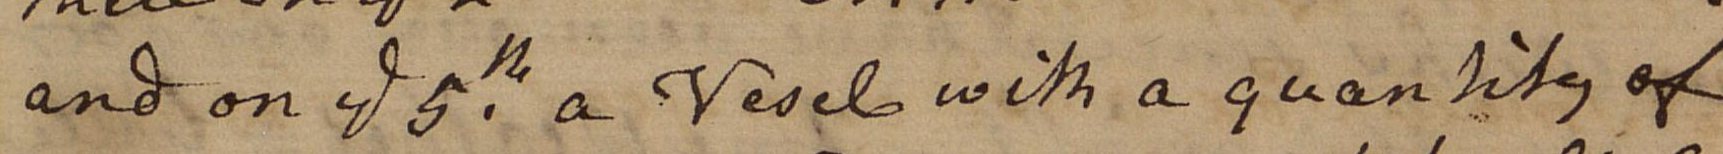and on y^e 5^th a Vesel with a quantity of
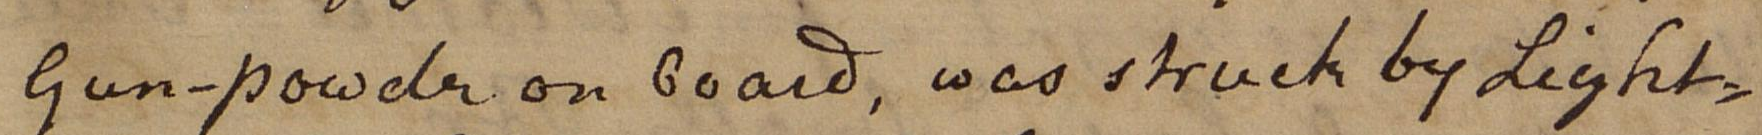Gun-powder on board, was struck by Light-
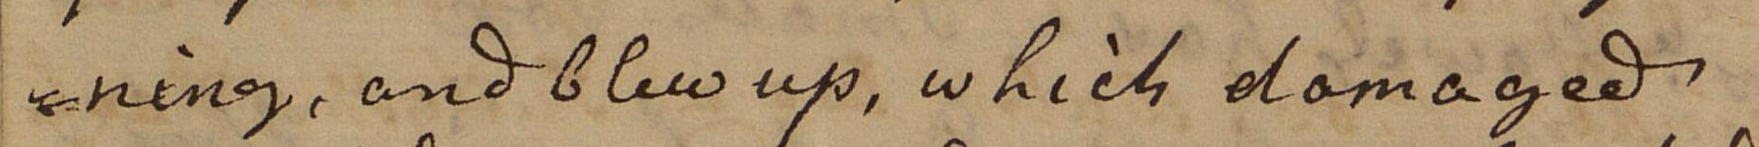-ning, and blew up, which damaged
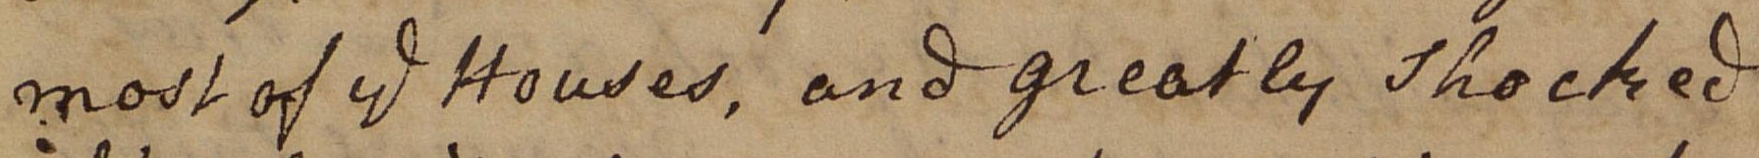most of y^e Houses, and greatly shocked
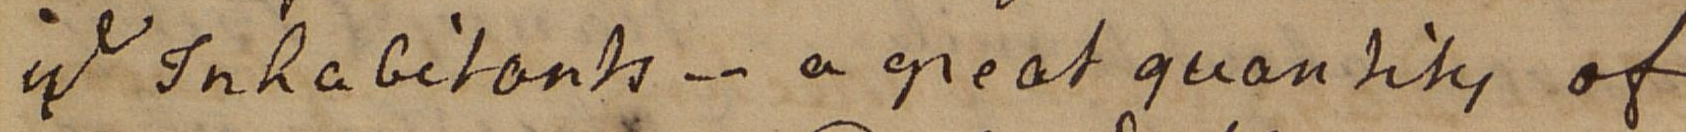y^e Inhabitants- a great quantity of
